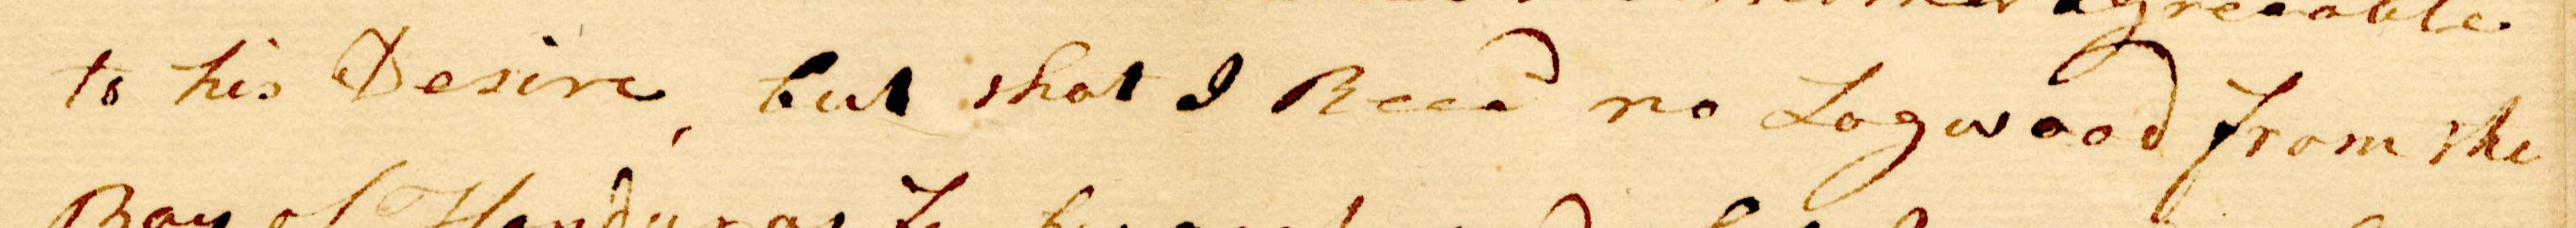to his Desire, but that I Rece^d no Logwood from the
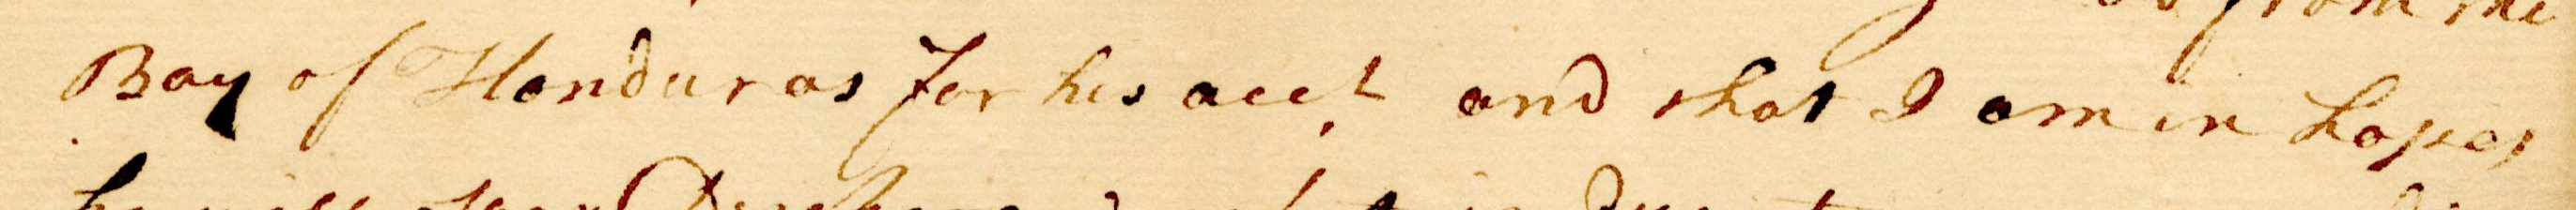Bay of Honduras for his acc^t and that I am in hopes
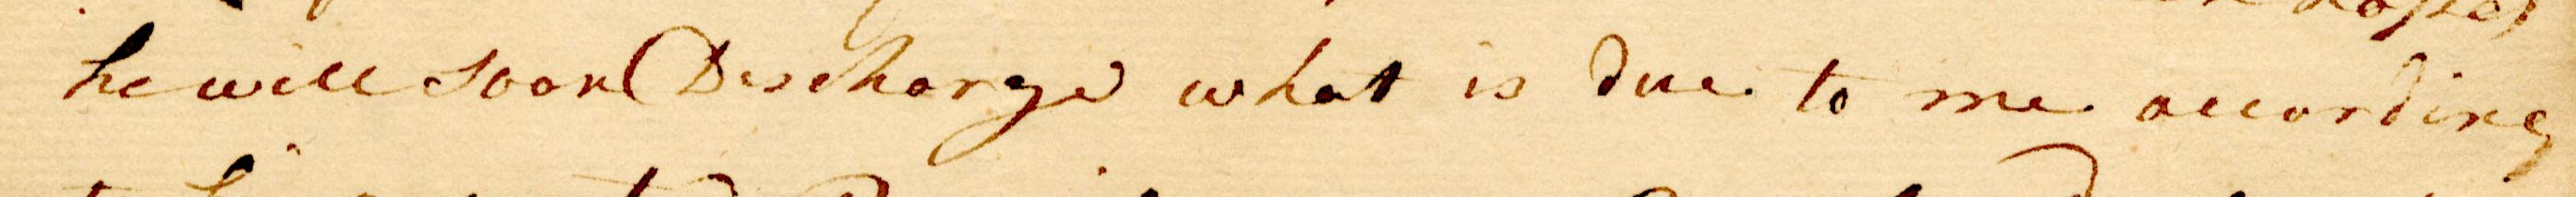he will soon Discharge what is due to me according
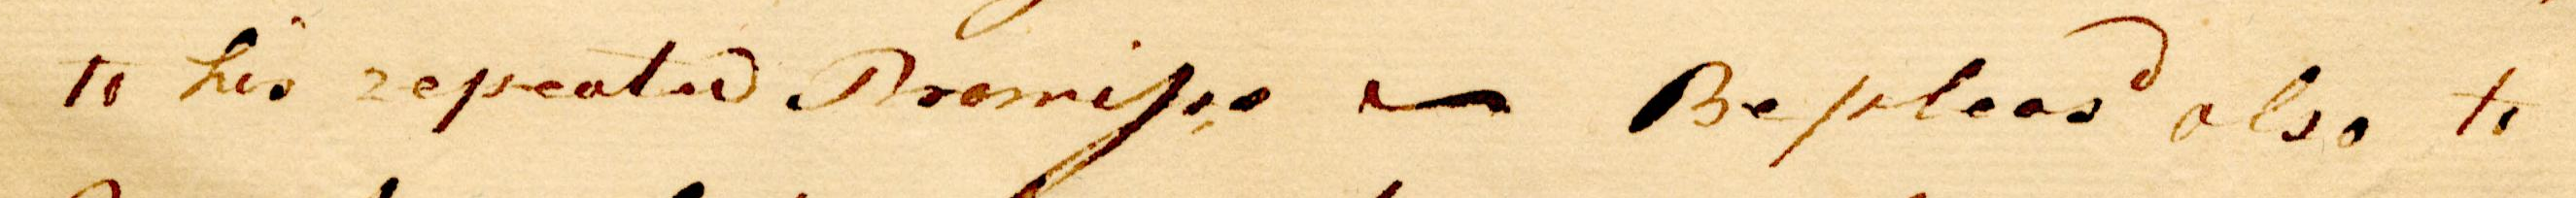to his repeated Promises- Be pleas^d also to
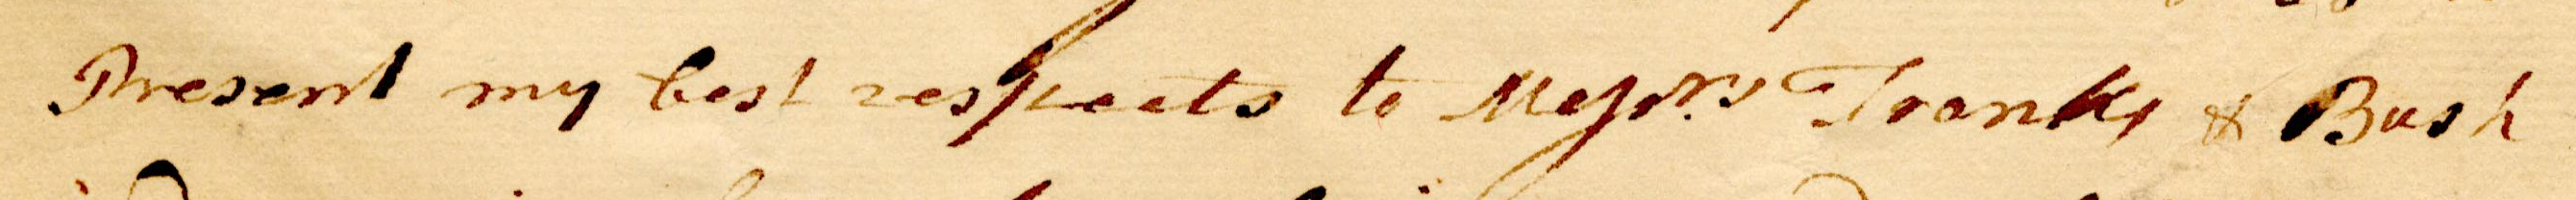Present my best respects to Mess^rs. Franks & Bush
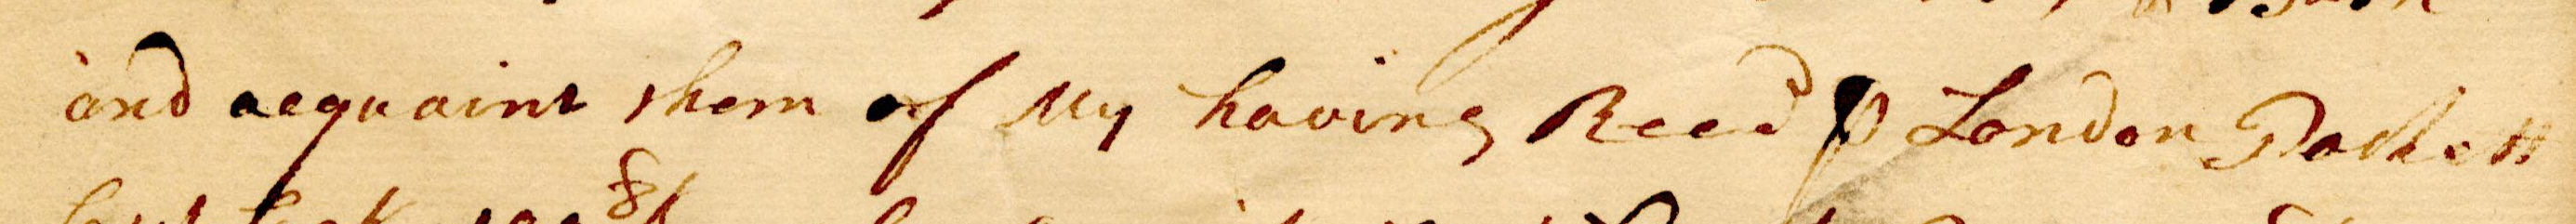and acquaint them of my having Rece^d per London Packett
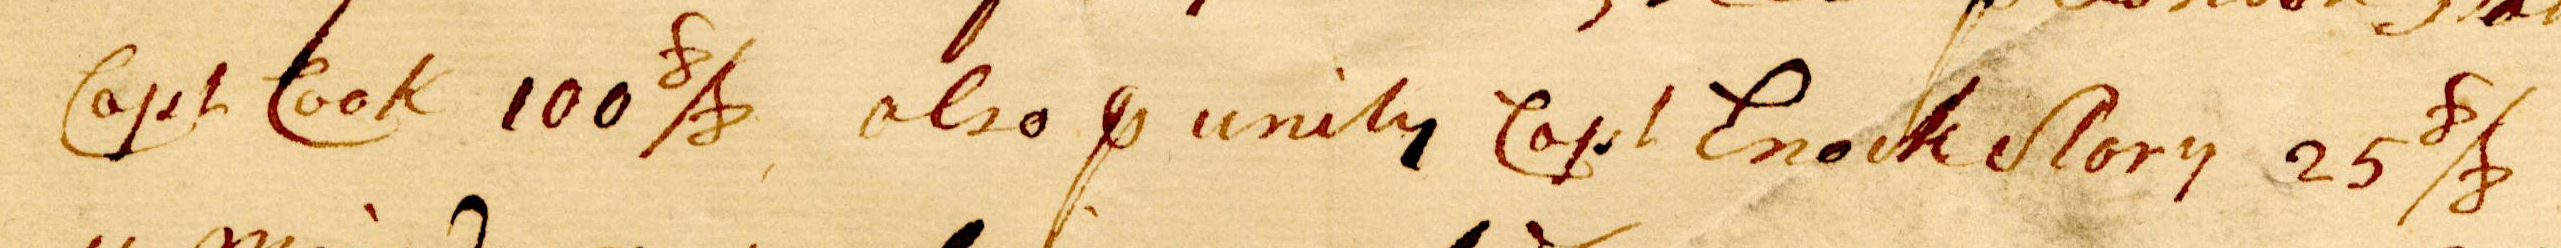Cap^t Cook 100 8/8 also per unity Capt Enock Rory 25 8/8
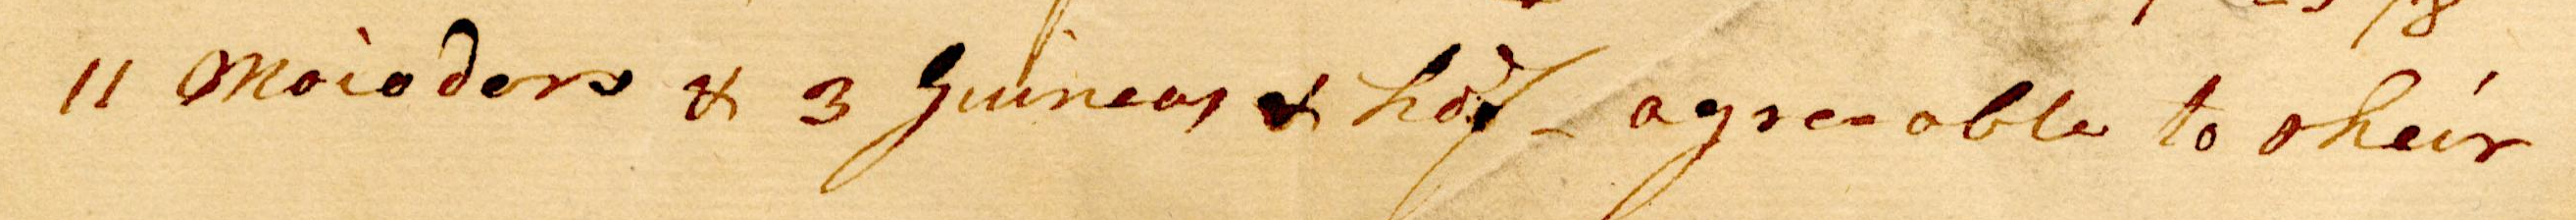11 moieders & 3 Guineas & hds- agreeable to their
